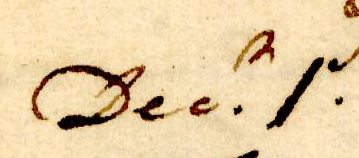Dec^r 1^st
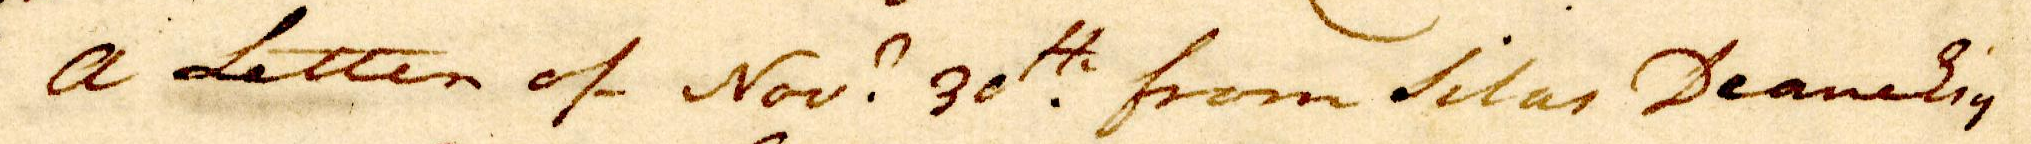A Letter of Nov^r. 30^th. from Silas Deane Esq^r
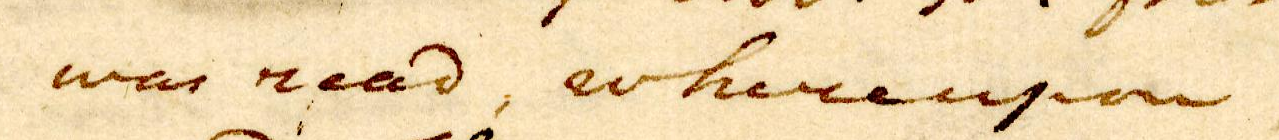was read whereupon
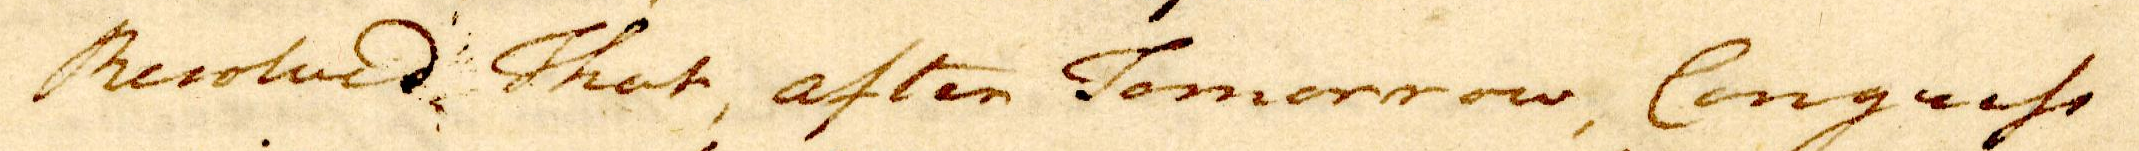Resolved That, after Tomorrow Congress
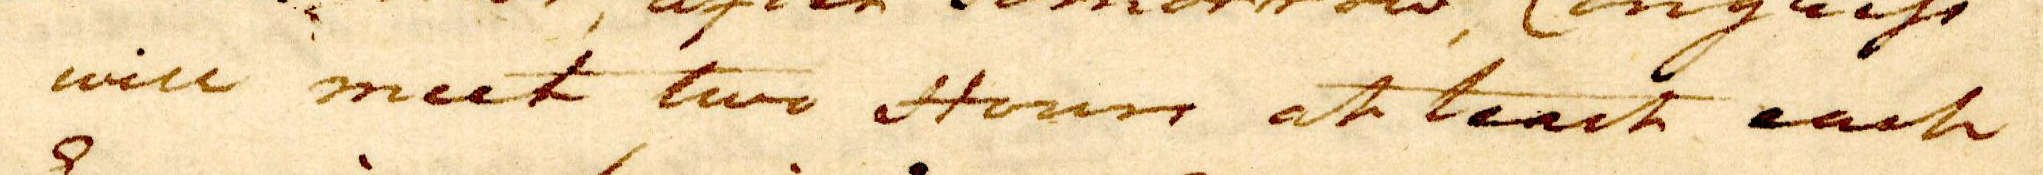will meet two Hours at tenth each
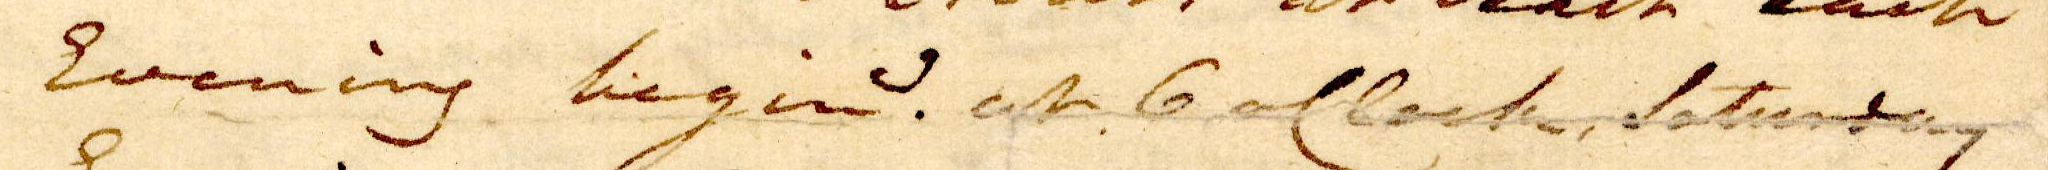Evening begin^g. at 6 oClock, Saturday
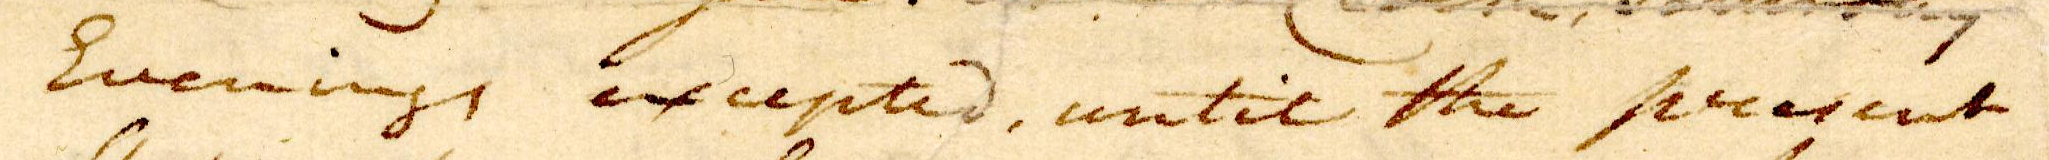Evening, excepted, until the present
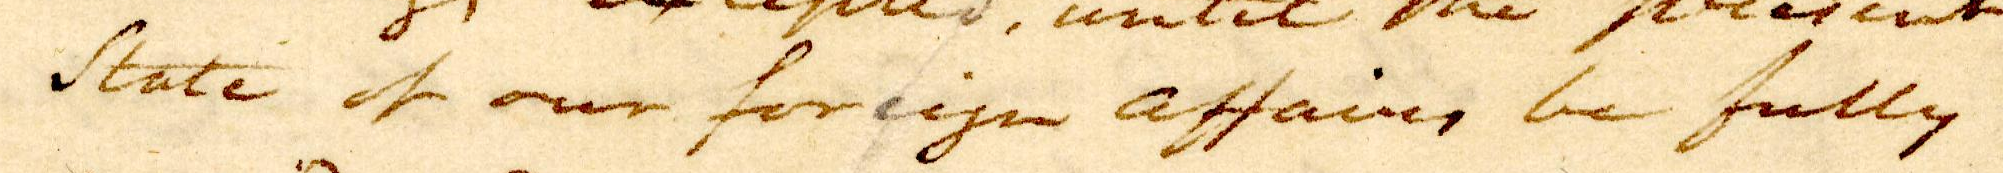state of our foreign affairs be fully
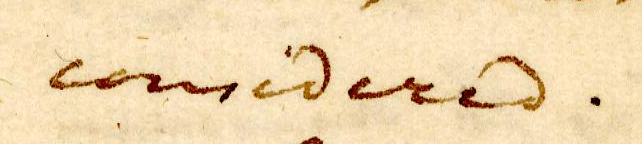considered.
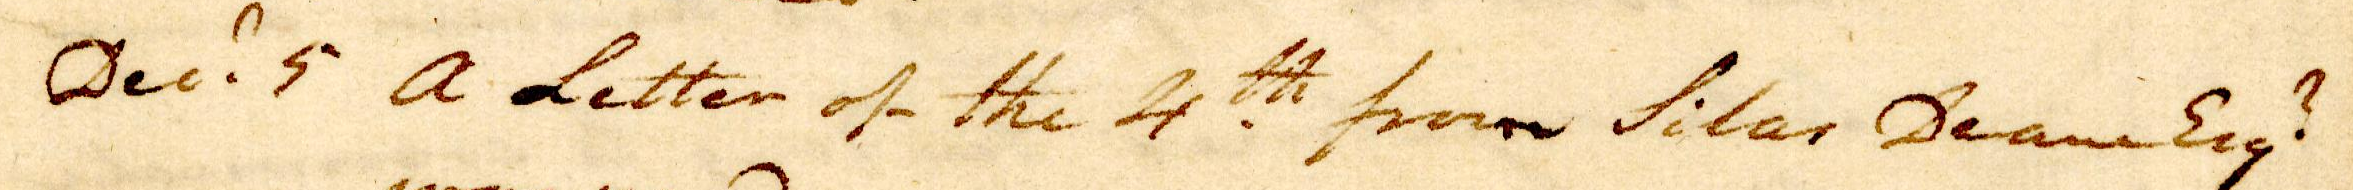Dec^r. 5 A Letter of the 4^th. from Silas Deane Esq^r.
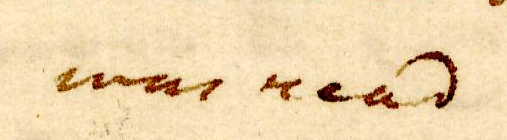was read
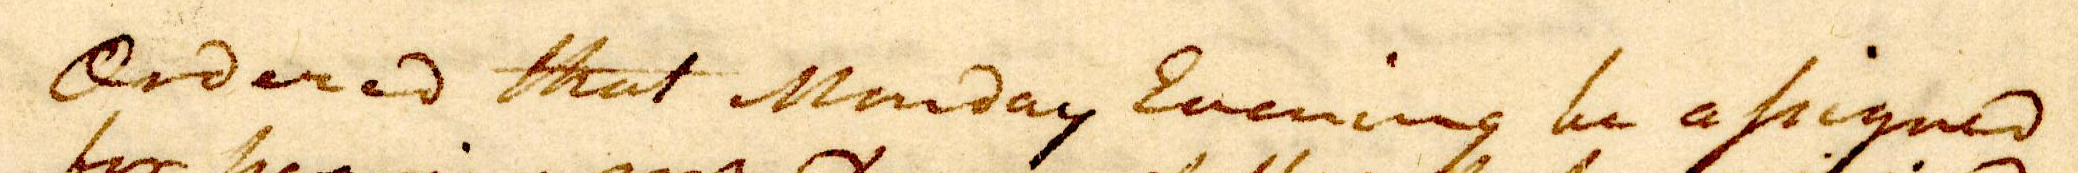ordered that Monday Evening be assigned
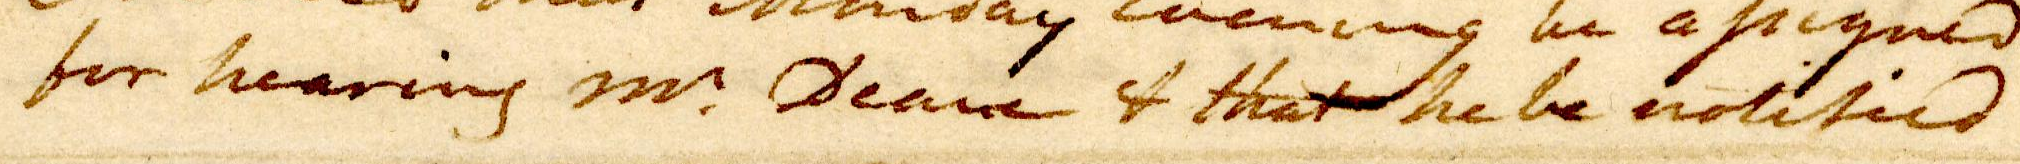for hearing M^r Deane & that he be notified
